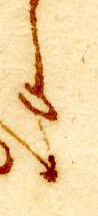To
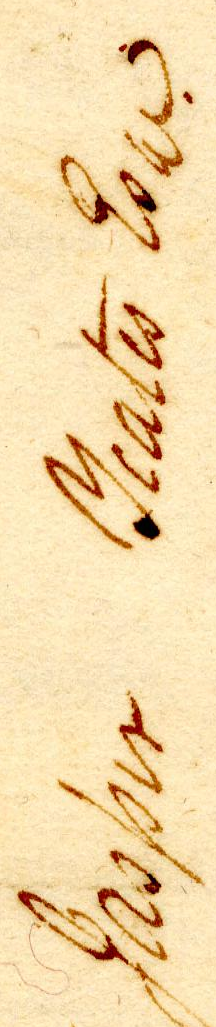Jasper Yeates Esq.
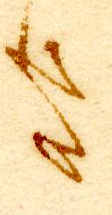at
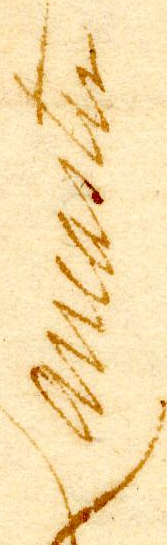Lancaster
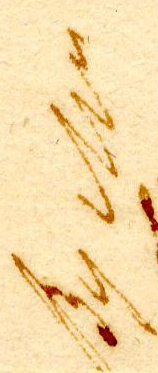By M^r
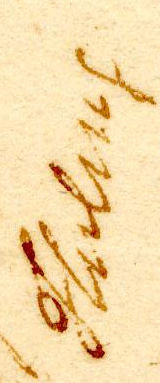Huling
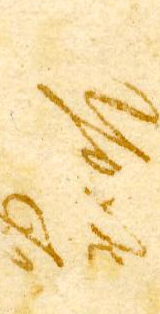York
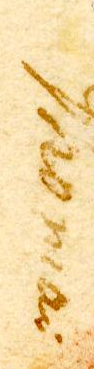Thomas
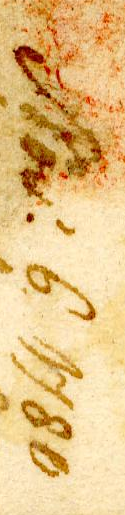Nov^r. 6 1780
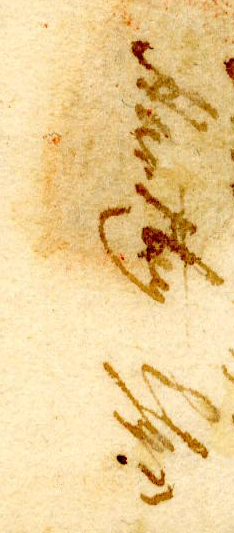Hartley Esq.
